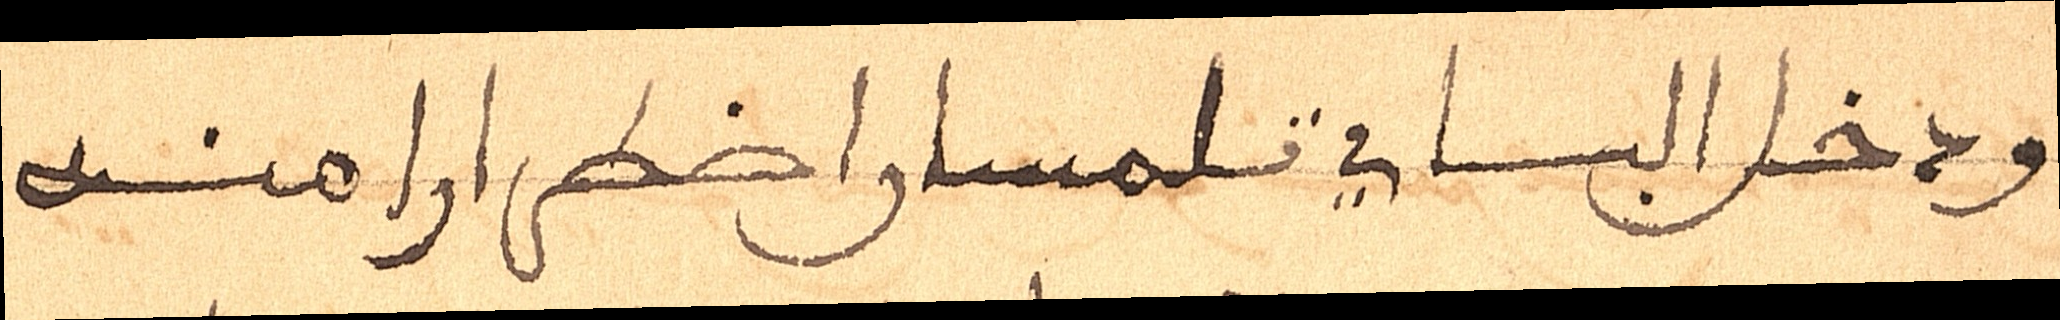ودخل الباي تلمسان اضطرارا منه
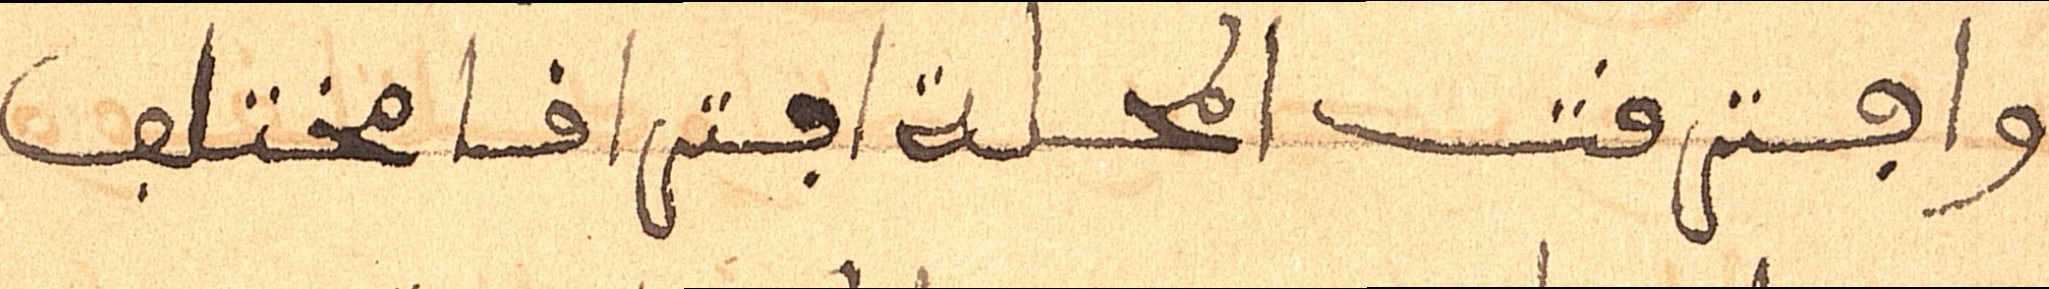وافترقت المحلة افتراقا مختلف
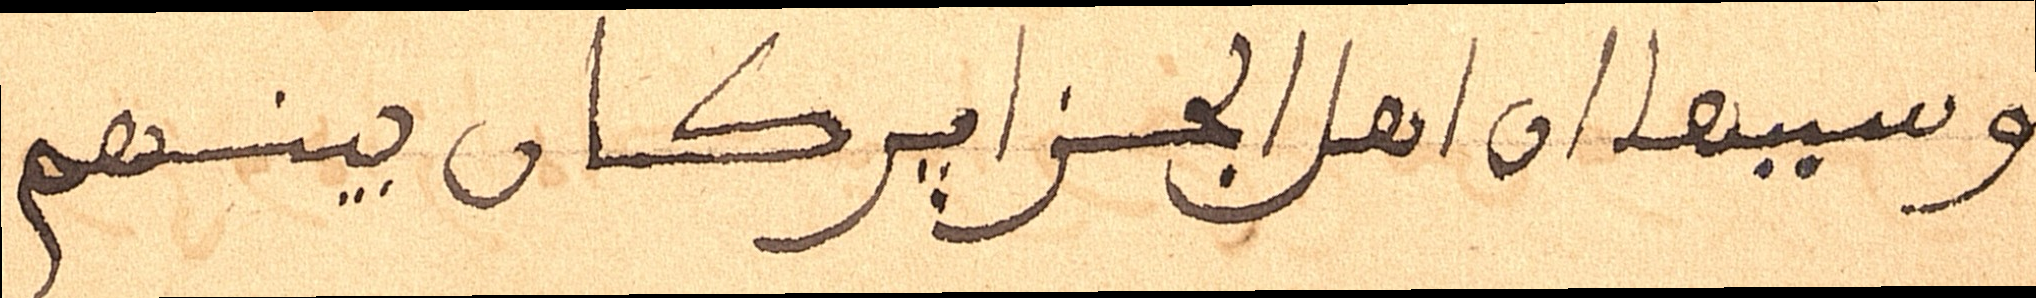وسببها ان اهل الجزائر كان بينهم
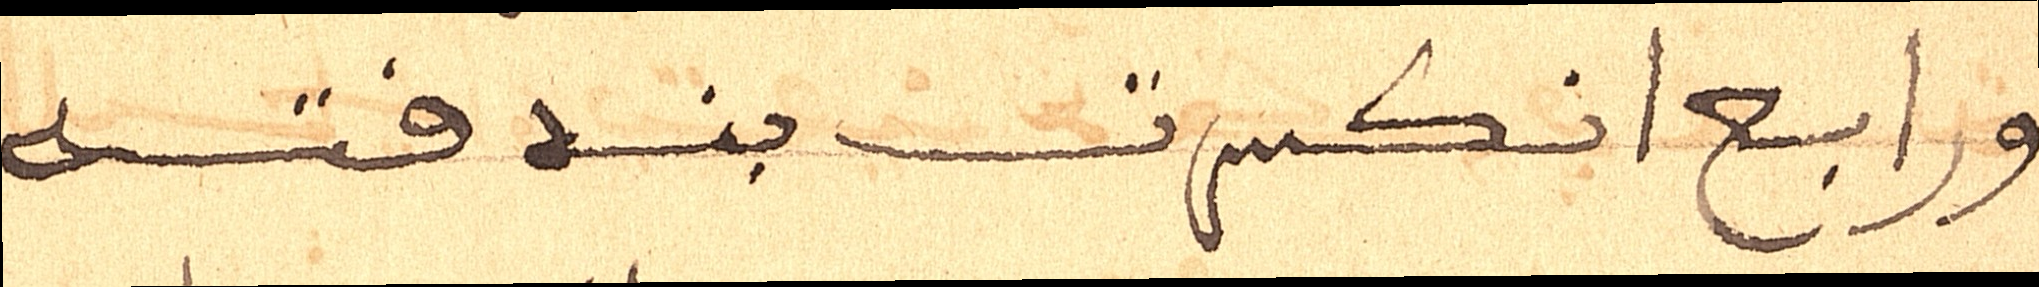ورابع انكسرت بندقته
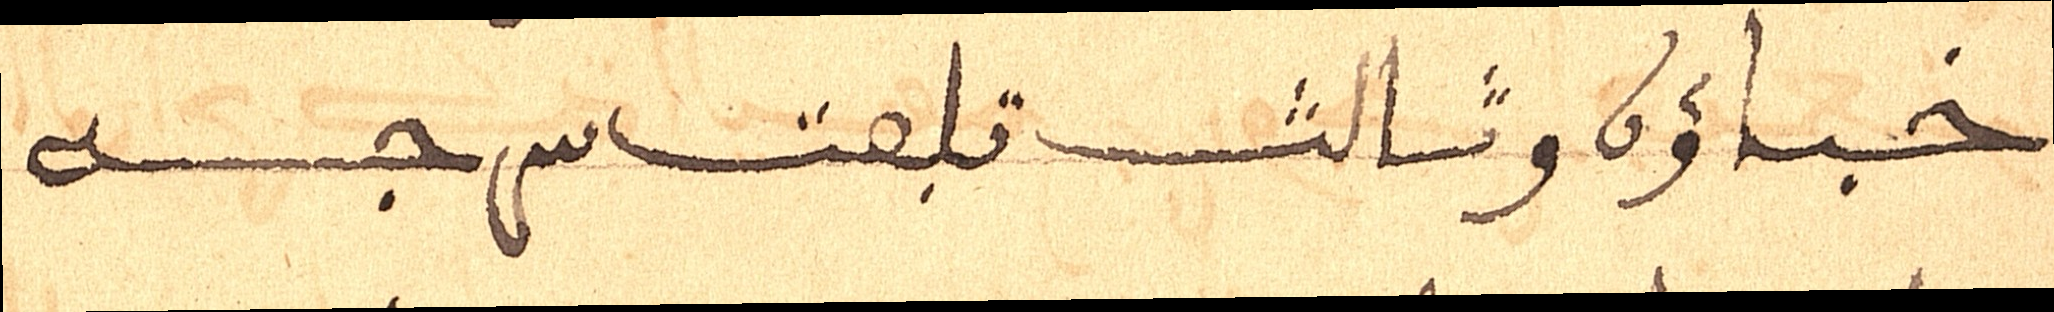خباؤه وثالث تلفت سرجه
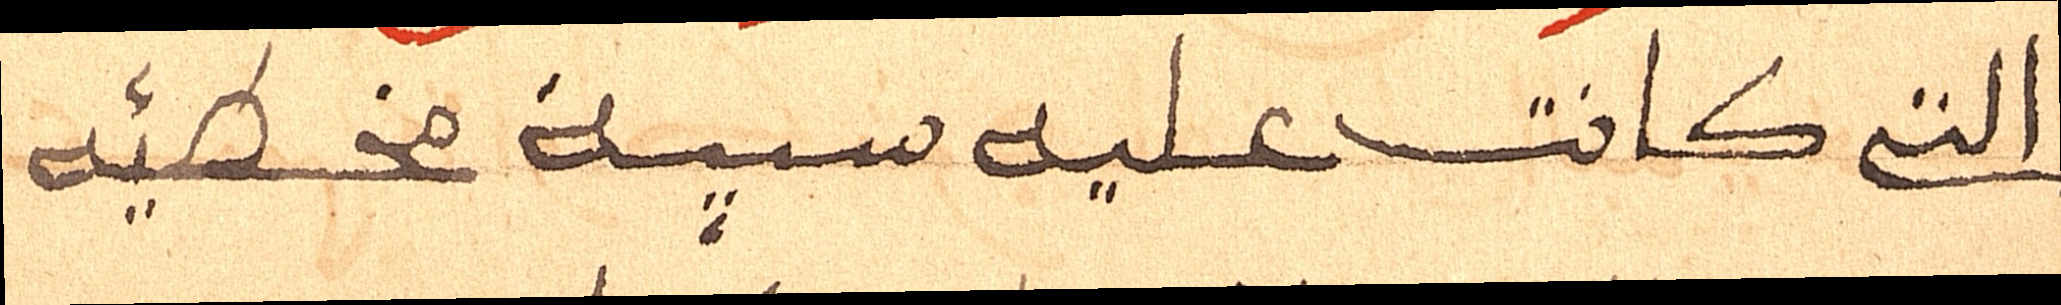التي كانت عليه سئه مخطئه
